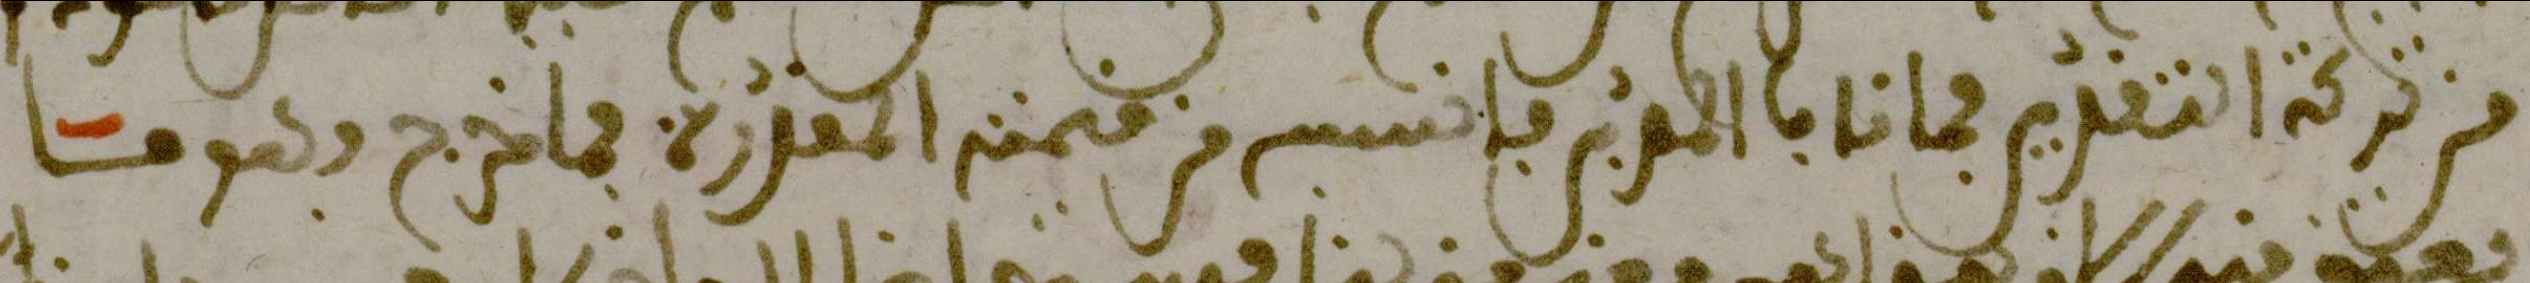من تركة التقدير فما ناب المدبر فانسبه من قيمة المقدرة فما خرج وهو مَا
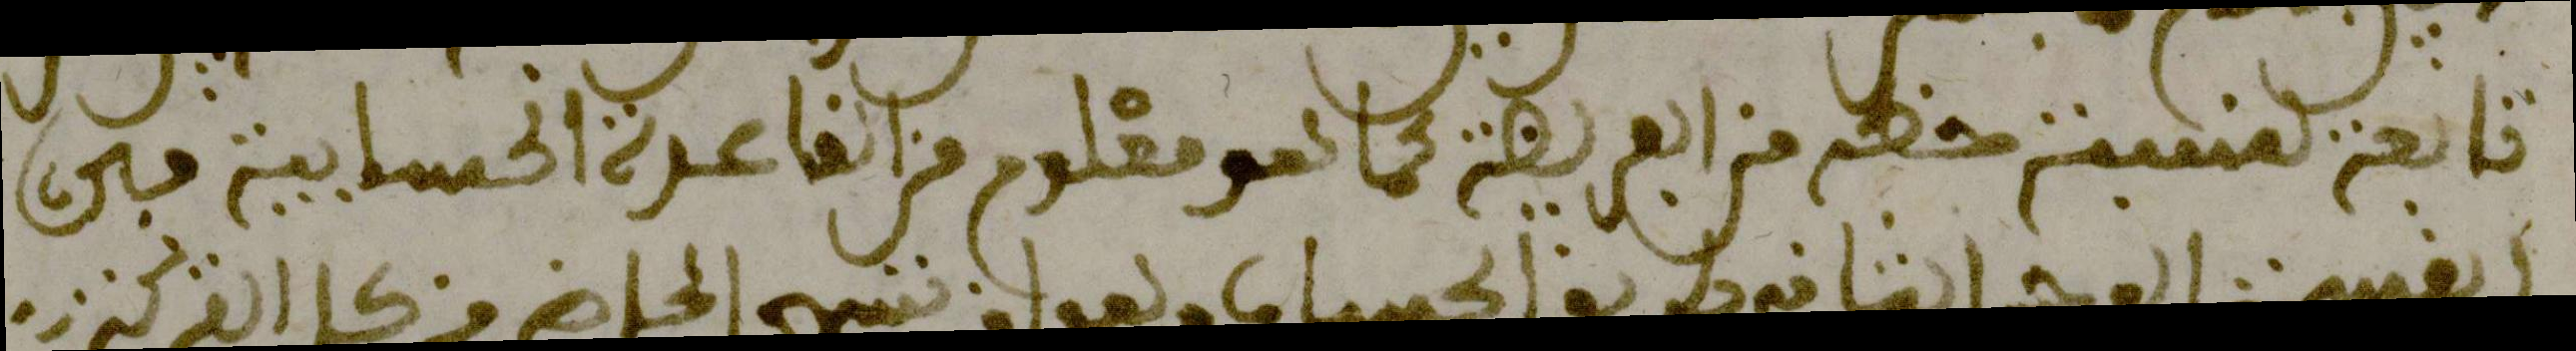تابعة لنسبة حظه من الفريضة كما هو معْلوم من القاعدة الحسابية في
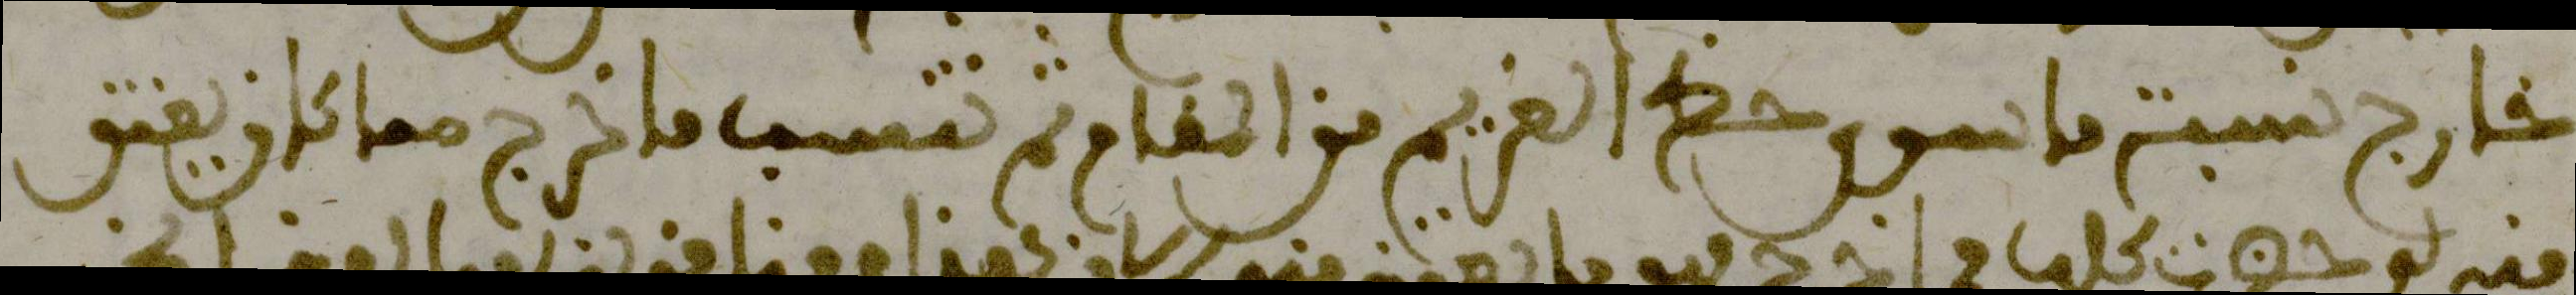خارج نسبة ما سوى حظ الغريم من المقام ثم تنسب ما خرج مما كان يعتق
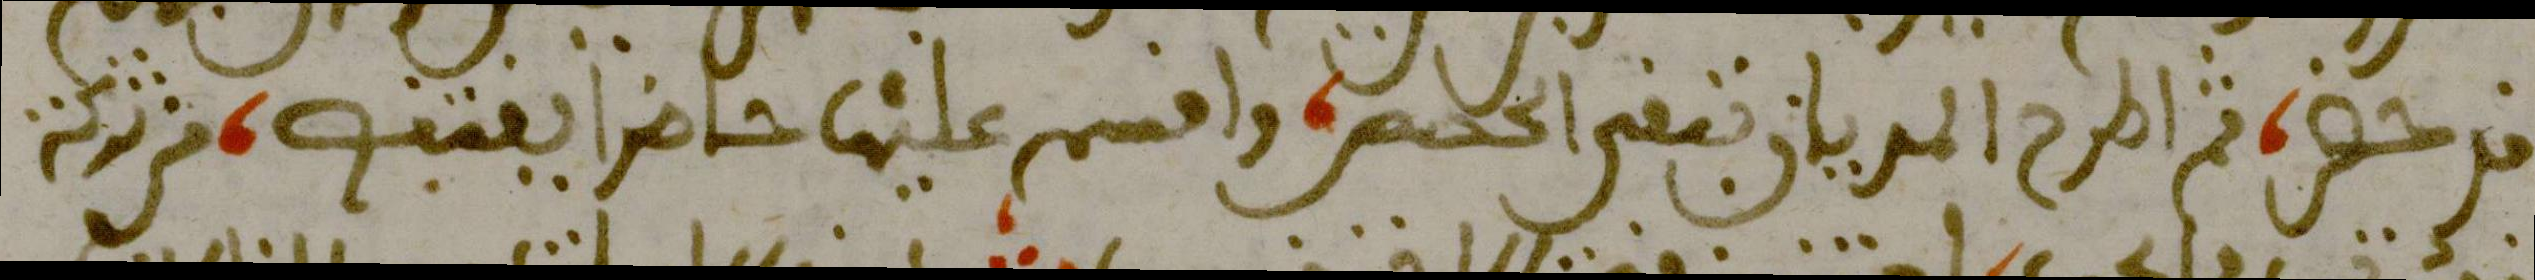قد حضر ثم اطرح المديان تبقى الحصص واقسم عليْها حاضرا يقتنص من تركة
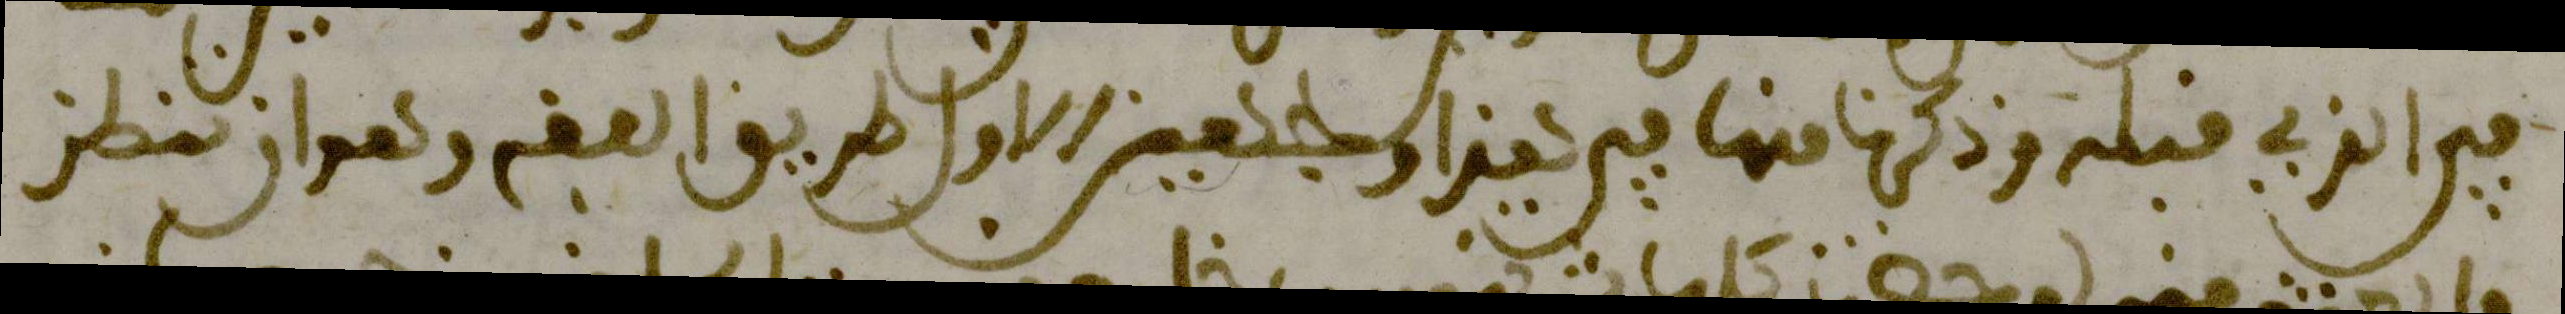في الذي قبله وذكرن منها في هذا وجهين الاول طريق الفقه وهو ان ينظر
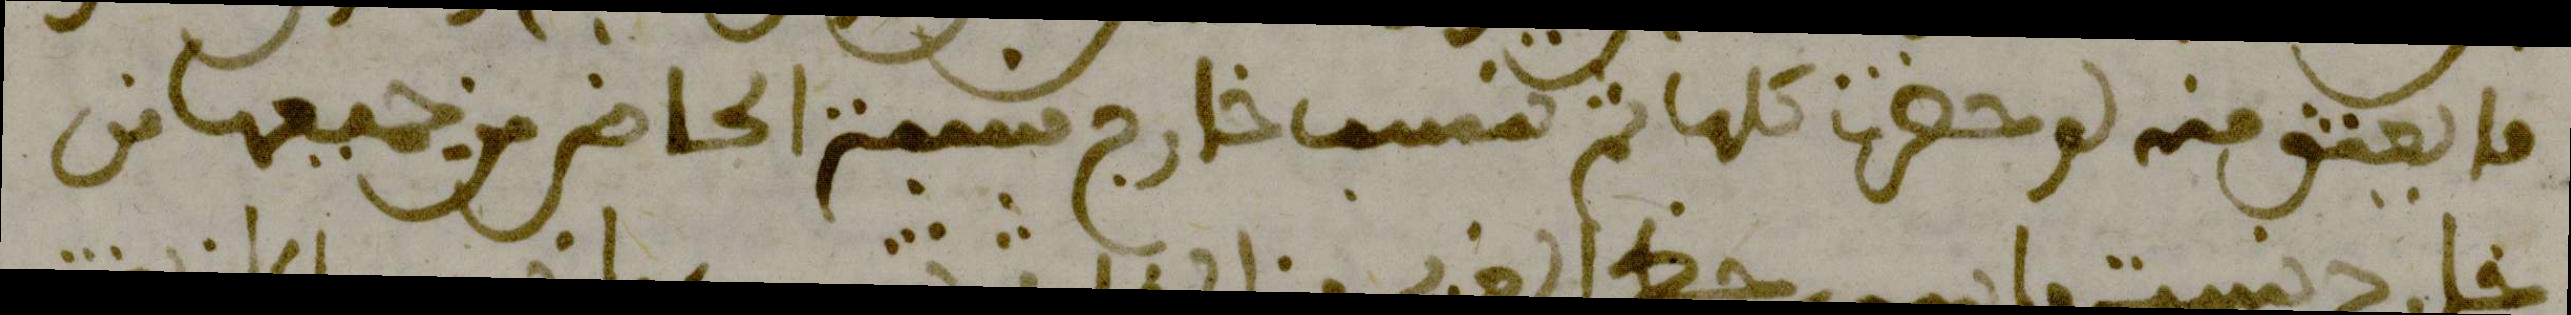ما يعتق منه لو حضرت كلها ثم ينسب خارج نسبة الحاضر من جميعها من
